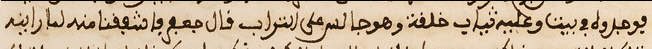فوجدوه في بيت وعليه ثياب خلقة وهو جالس على التراب قال جعفر فاشفقنا منه لما راينه
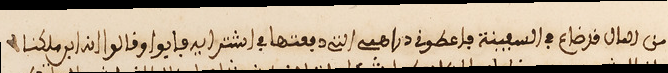من المال قد ضاع في السفينة فاعطو في دراهمى التى دفعتها في اشترايه فابو او قالوا انه ابن ملكنا
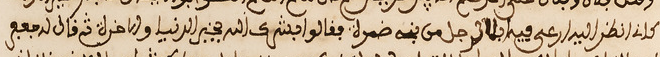كانى انظن اليه ارعى فيما بلا لرجل من بنى ضمرة فقالوا بشرك الله يخبر الدنيا والاخدة ثم قال له جعفر
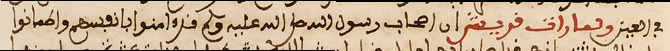في العين ولما رات قريش ان اصحاب رسول الله صلى الله عليه وسلم قد ءامنوا بانفسهم واطمانوا
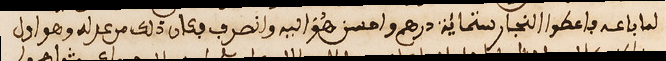لما باعه فاعطوا النجار ستحائة درهم واحسن هو اليه وانصرف فكان ذلك من عدله وهو اول
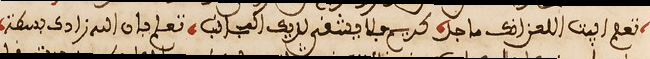تعلم ابيت اللحن انك ماجل كريم فلا يشعنى يديك المجانب تعلم بان الله زادك بسطة
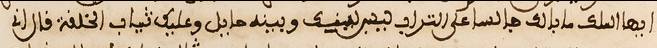ايها السلك ما بالك جالسا على التراب ببس بينك وبينه حايل وعليك ثياب الخلقة قال انى
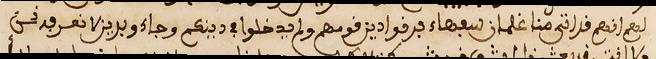لهم انهم قد اتى منا غلمان سفهاء فرقوا دين قومهم ولم يد خلوا في دينكم وجاء وبدين لا نعرفه نحن
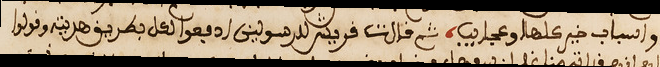واسباب خير كلها وعجايب ثم قالت قريش للرسولين ادفعوا لكل بطريق هريته وقولوا
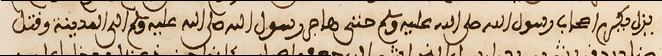يزل يكرم اصحاب رسول الله صلى الله عليه وسلم حتى هاجر رسول الله صلى الله عليه وسلم الى المدينة وقتل
